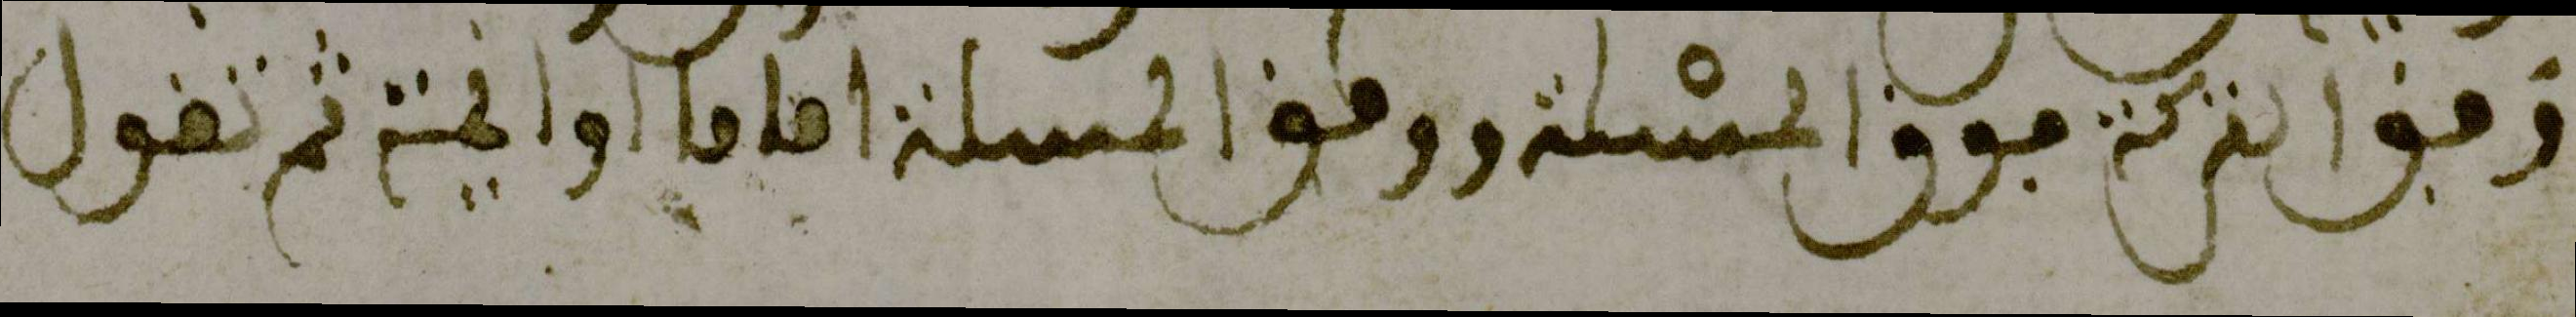وَفق التركة فوق المسْلة وفق المسلة اماما او ايمة ثم تقول
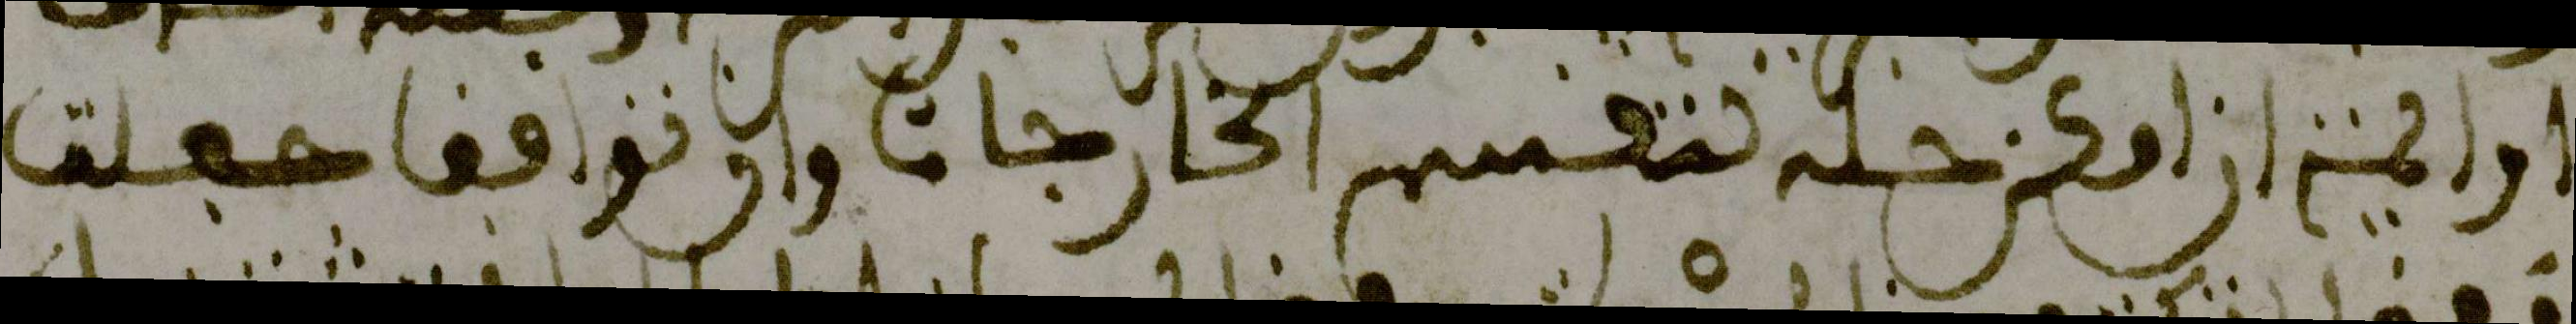او ايمة ان امكن حله لتقسم الخارجات وان توافقا جعلت
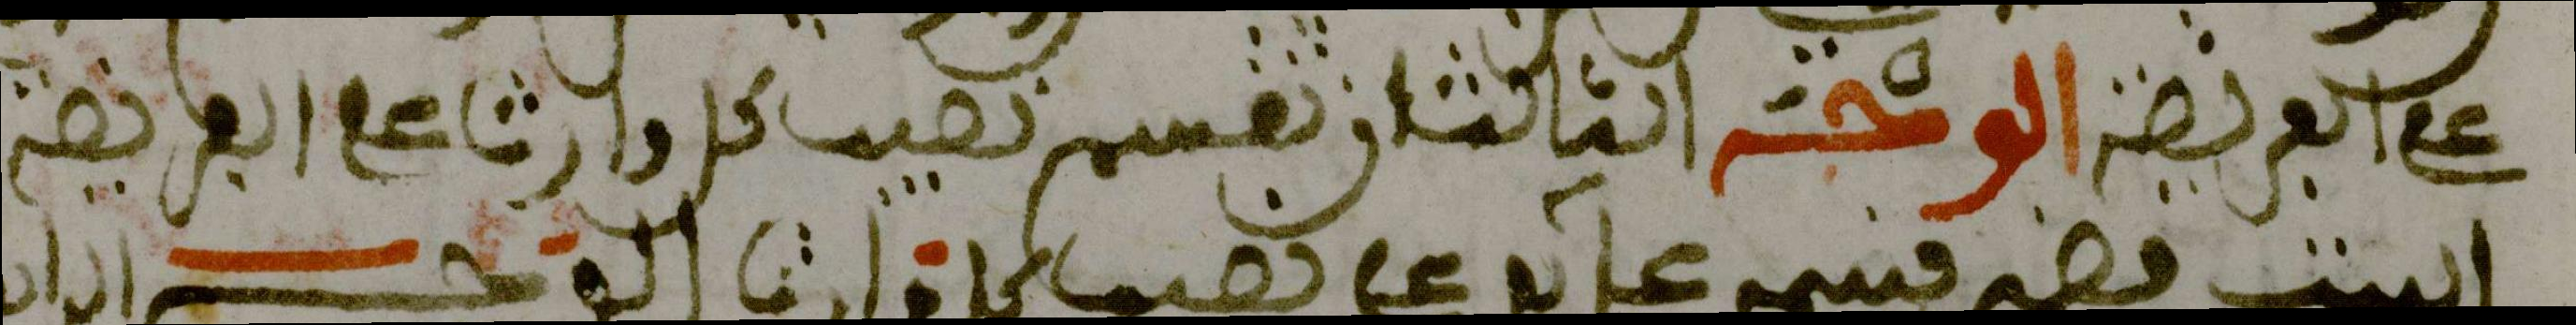على الفريضة الوجْهَ الثالث ان تقسم نصيب كل ووارث على الفريضة
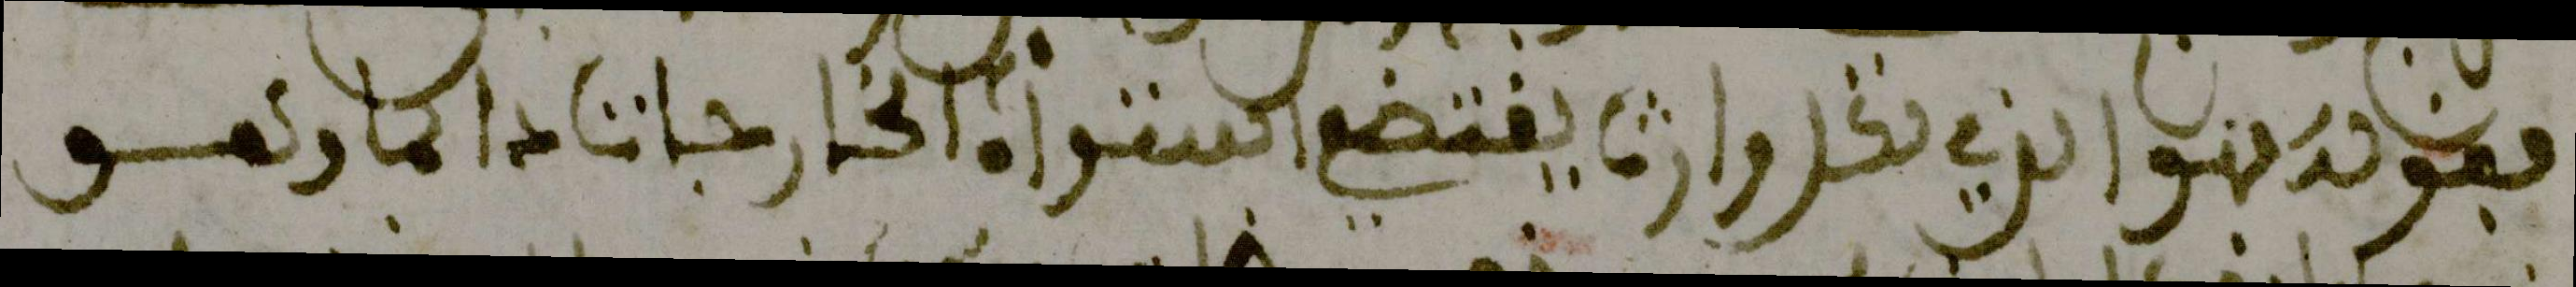فقولك فهو الذي لكل ووارث يقتضي استواء الخارجات داىما وهو
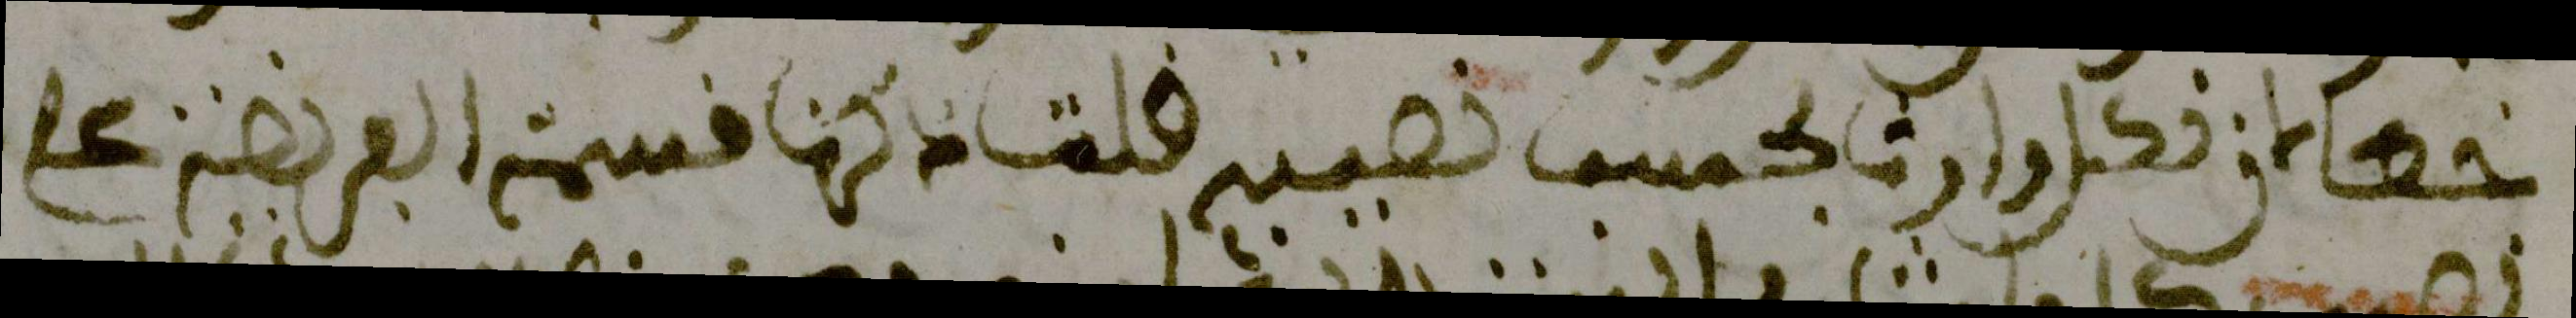خطا لان لكل وارث بحسب نصيبه قلت ذكرن قسمة الفريضة على
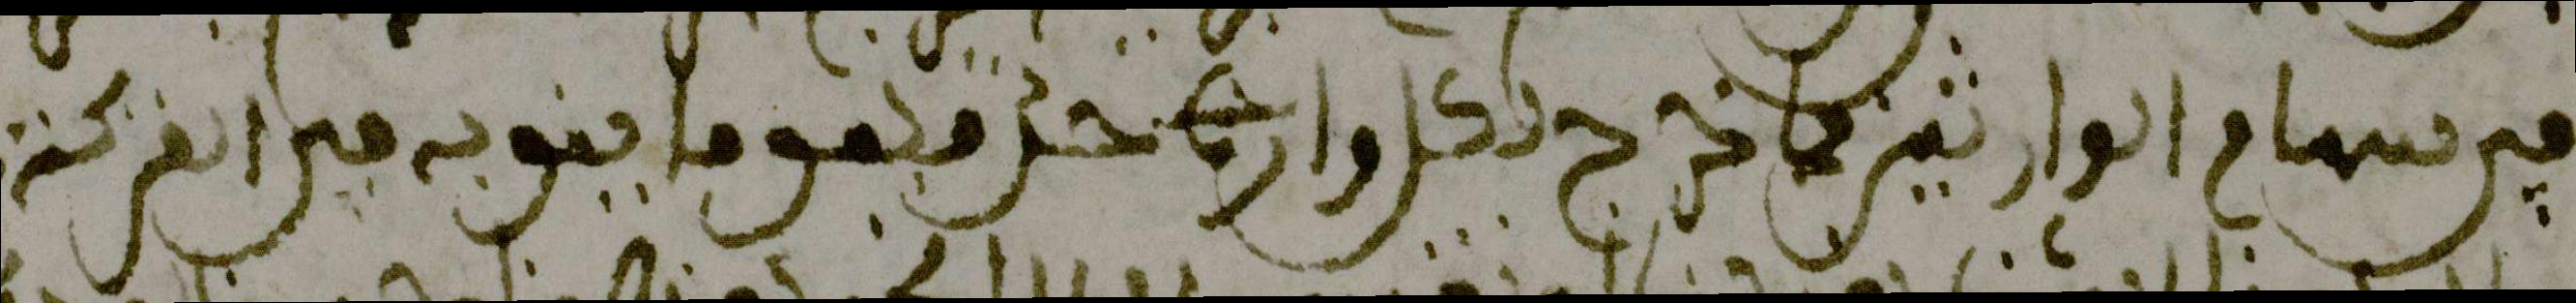في سهام الوارثين فما خرج لكل وارث حد فهو ما ينوبه في التركة
